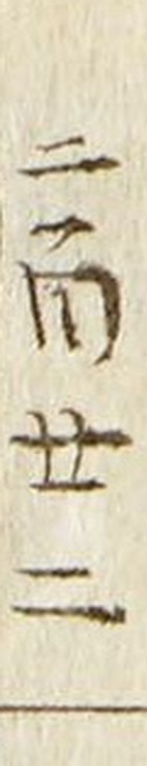二百廿ニ
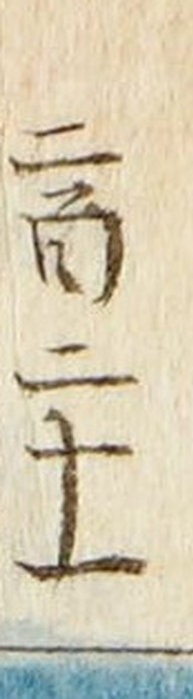二百二十一
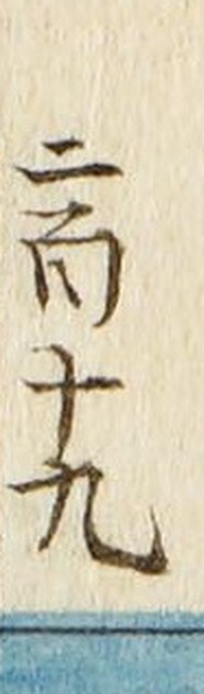二百十九
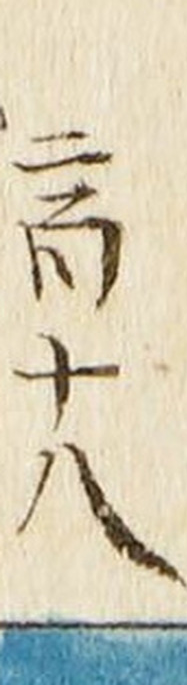二百十九
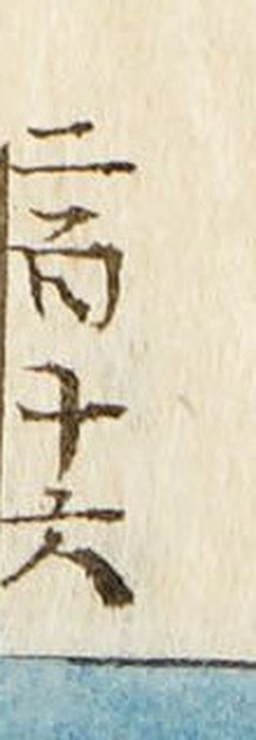二百十九
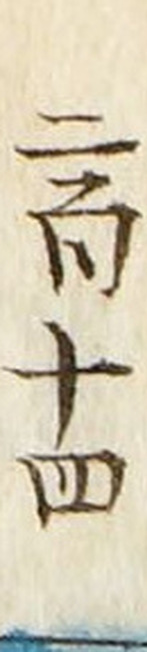二百十九

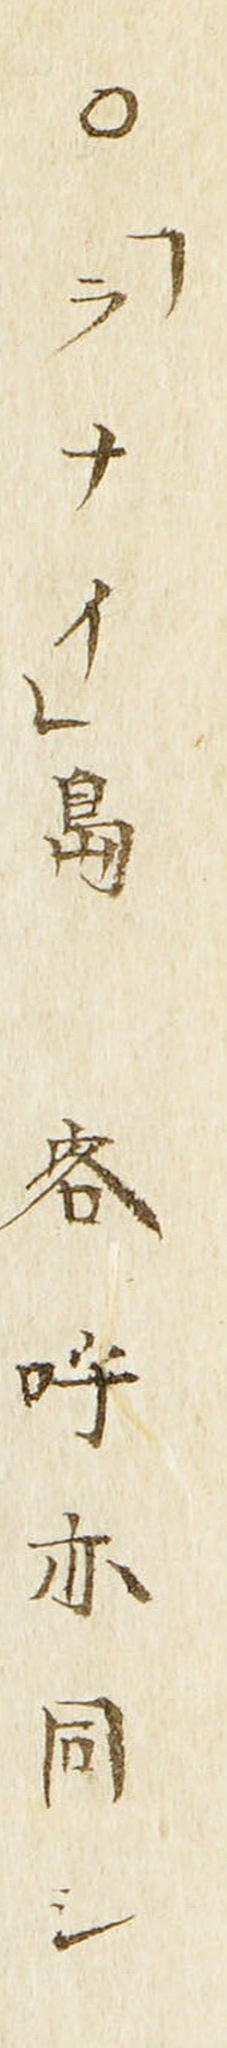〇「ラナイ」島客呼亦同シ
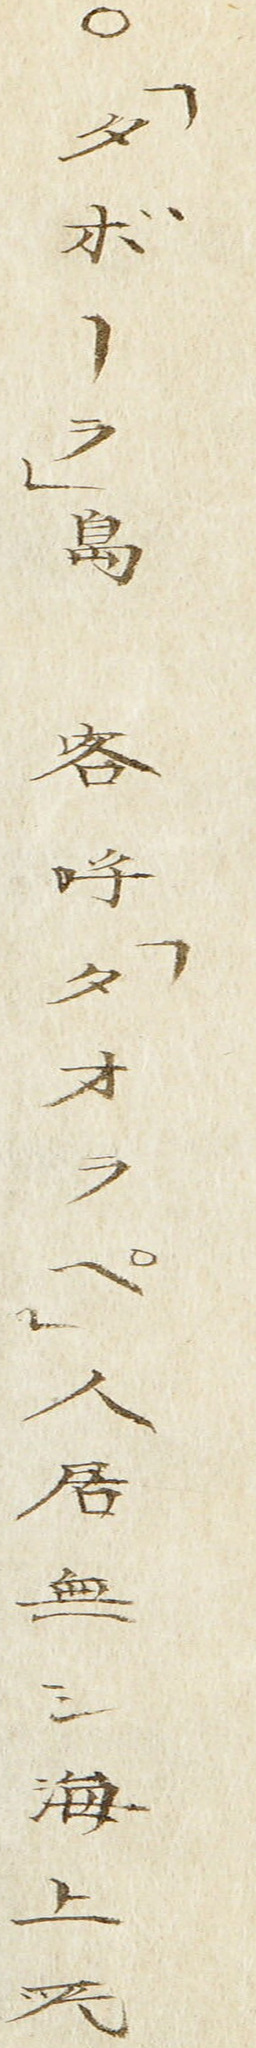〇「タボーラ」島客呼「タオラペ」人居無シ海上所？
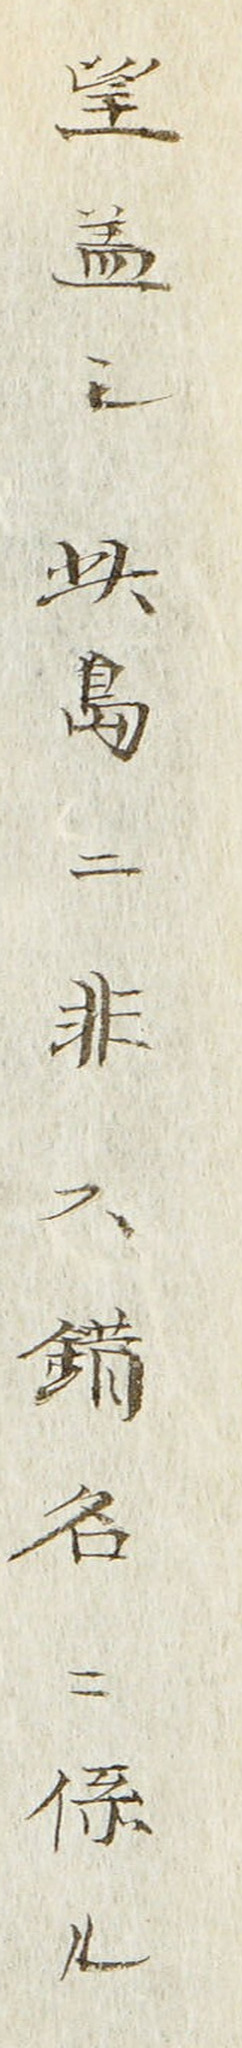望蓋シ此島ニ非ス錯名ニ係ル
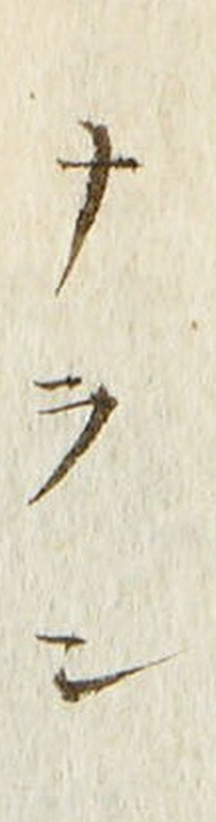ナラン
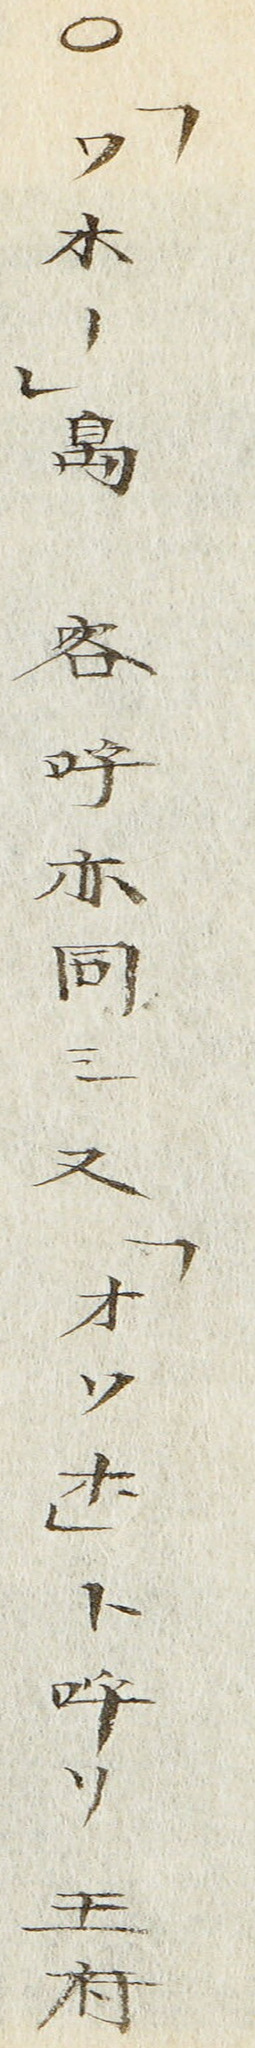〇「ワホー」島客呼亦同シ又「オソホ」ト呼リ王府
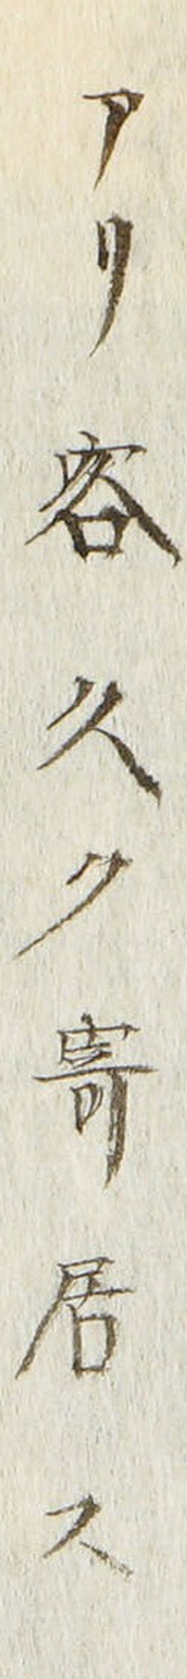アリ客久ク寄居ス
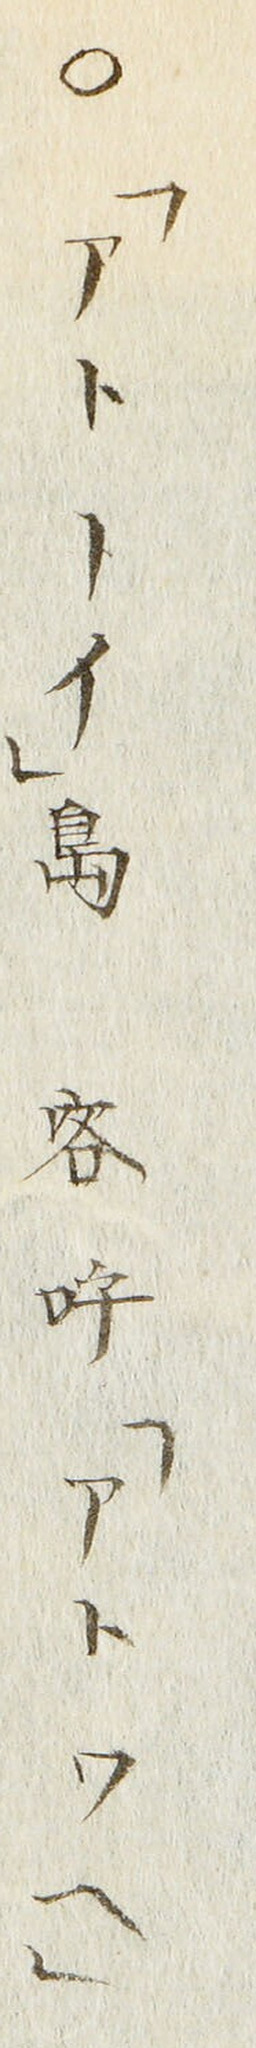〇「アトーイ」島客呼「アトワヘ」
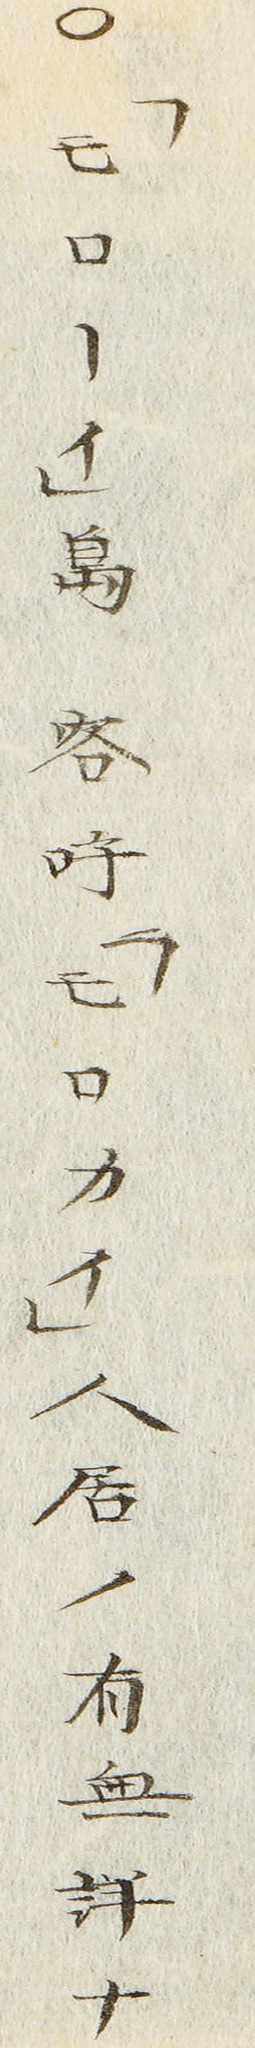〇「モローイ」島客呼「モロカイ」人居ノ有無詳ナ
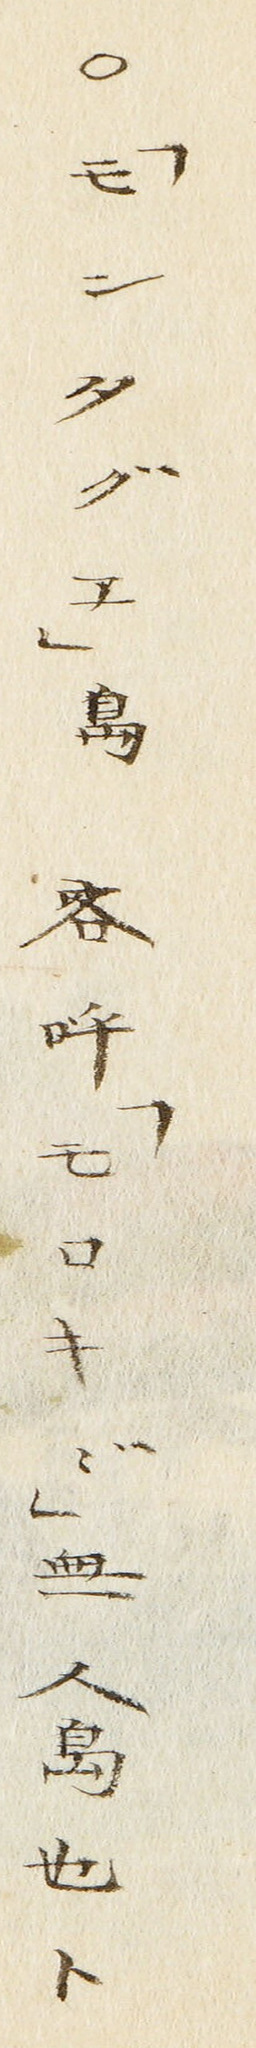〇「モンタグヱ」島客呼「モロキゞ」無人島也ト
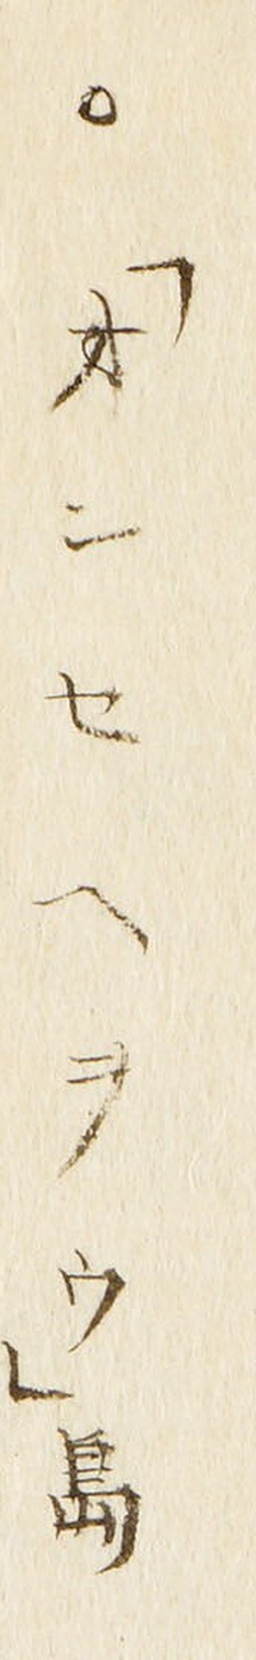〇「オンセヘヲウ」島
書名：蕃談
